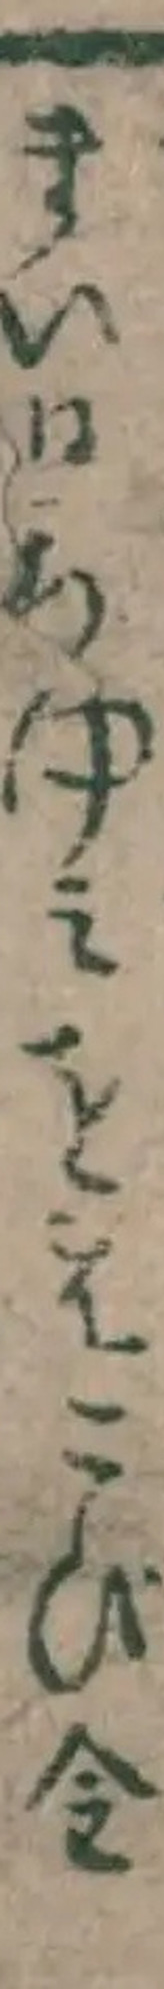まい日あゆみをはこび金
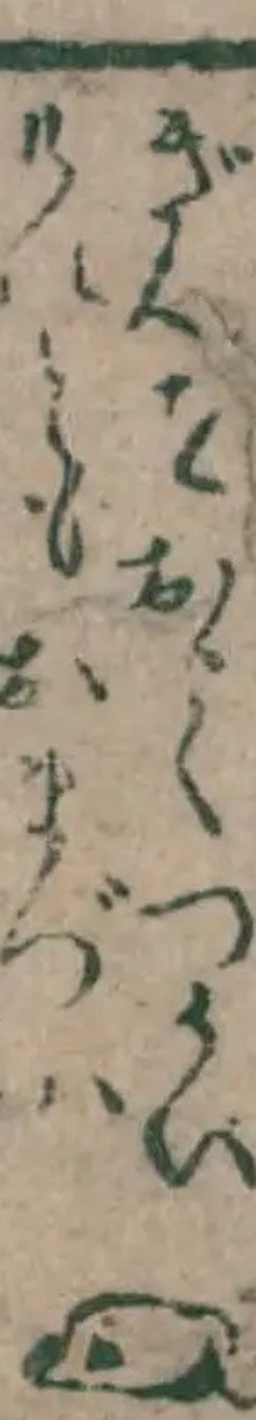けれともおまづは
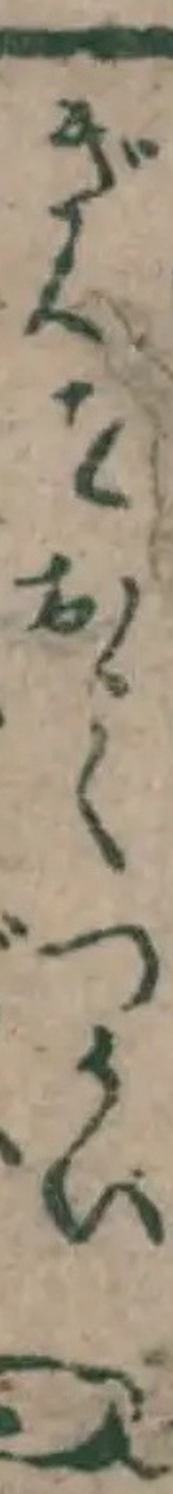ぎんをおゝくつかい
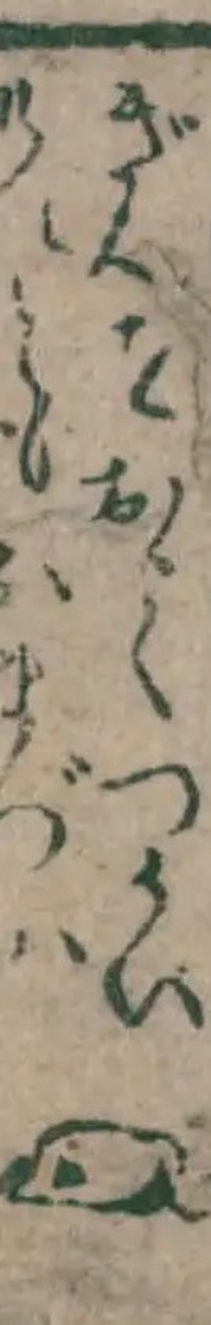ぎんをおゝくつかい
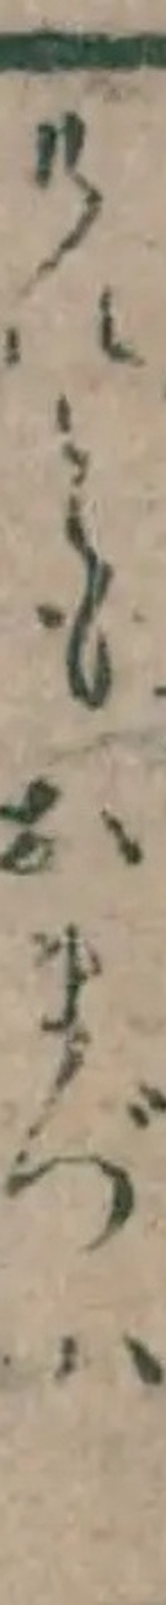けれともおまづは
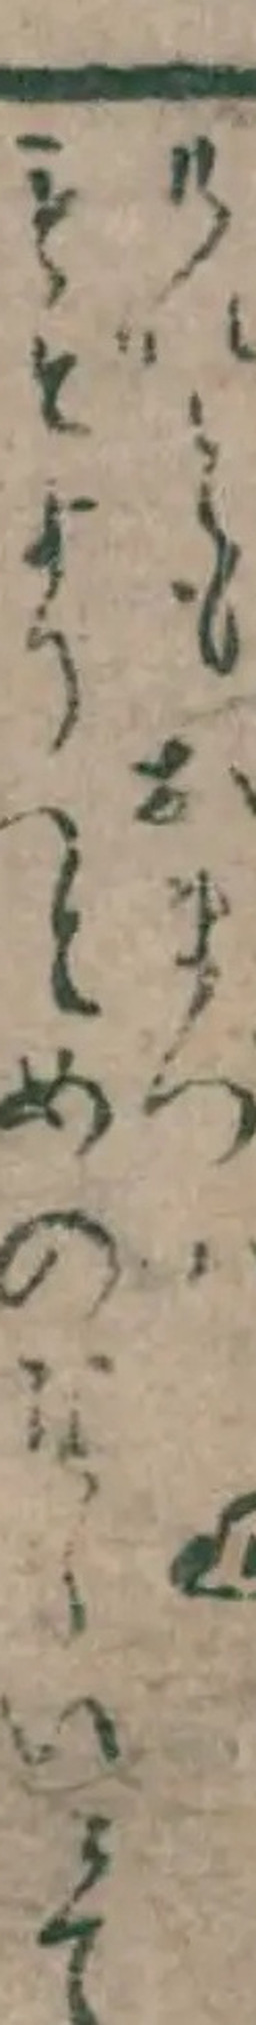もとよりつとめのならいにて
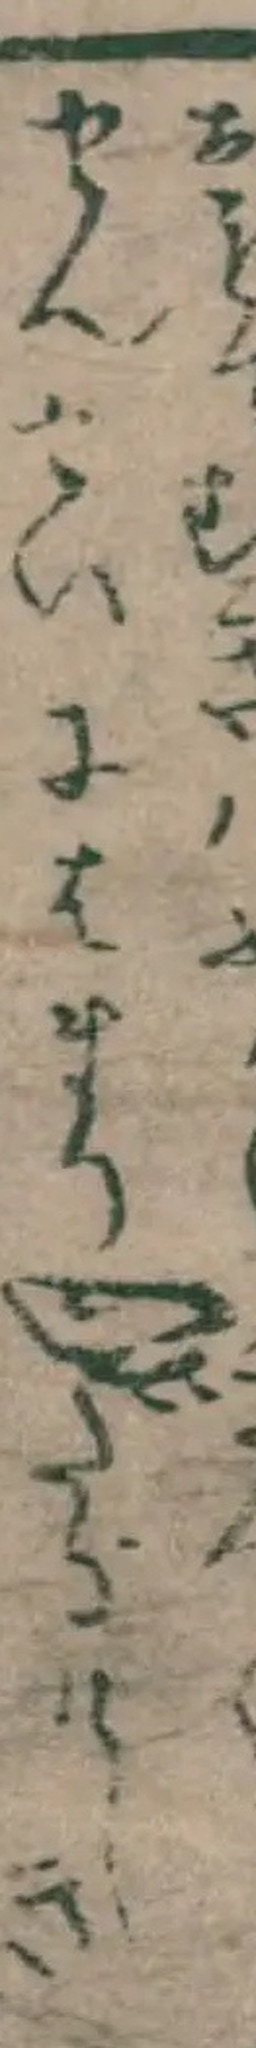せんせいにはまりたるけしきに
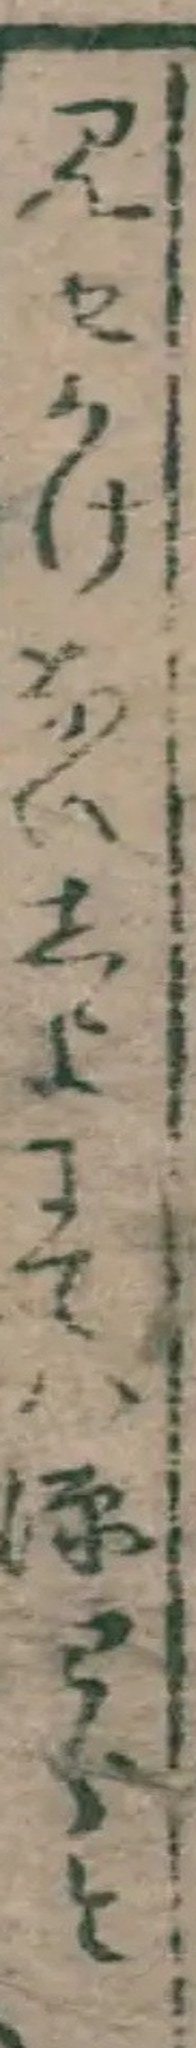見せかけないしよにては源四郎と
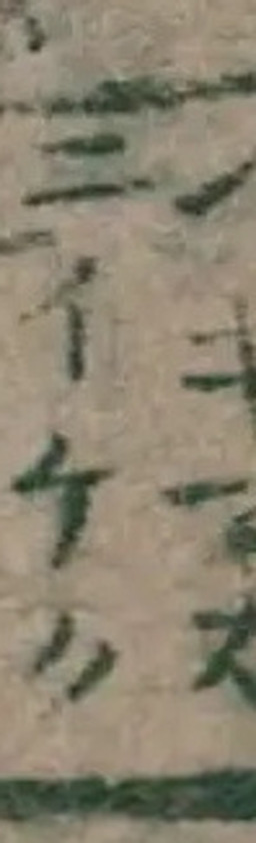ニイケク
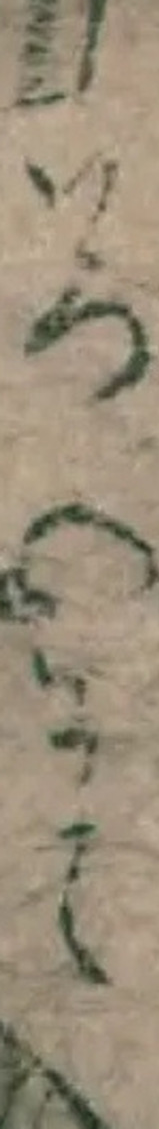いろにて
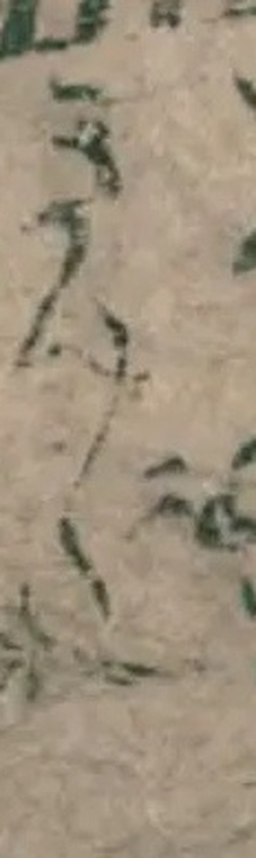きん〳〵
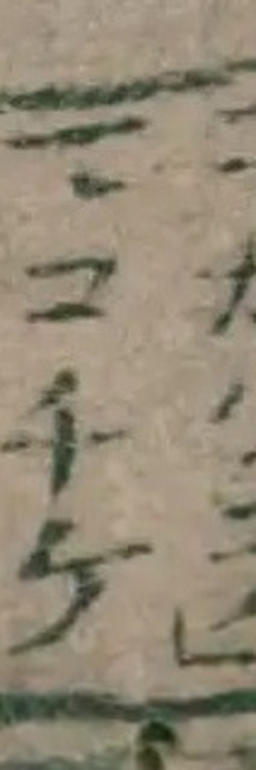マコチケ
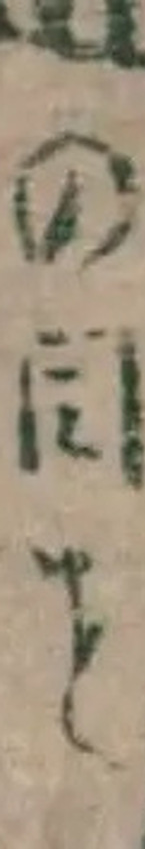の目を
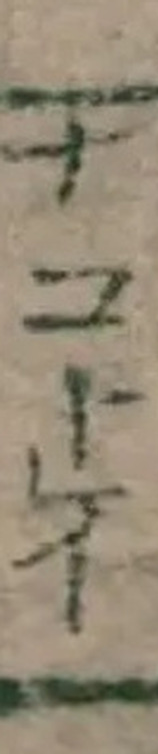ナコトイ
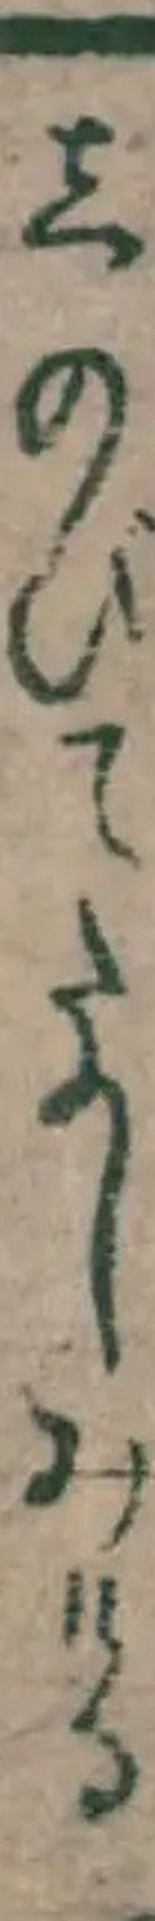しのびてたのしみける
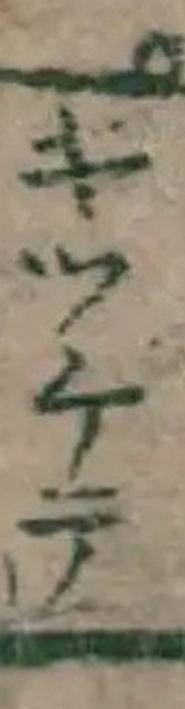キツケテ
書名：金々先生栄花夢 : 2巻
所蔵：国立国会図書館 National Diet Library, JAPAN
